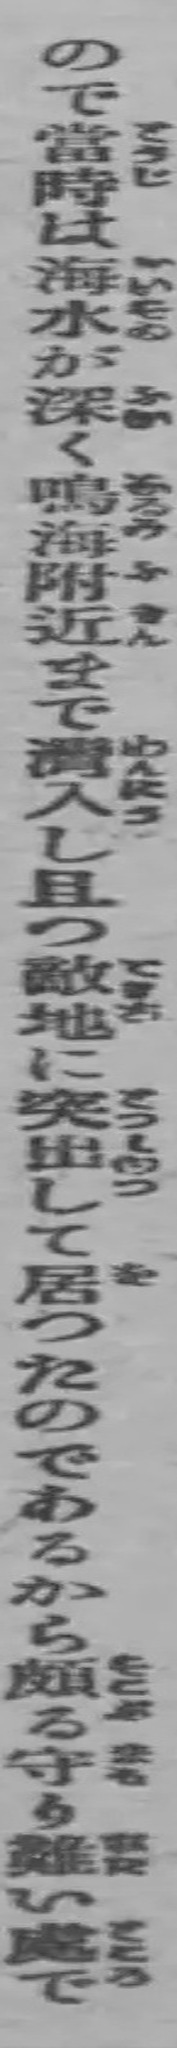ので当時は海水が深く鳴海附近まで灣入し且つ敵地に突出して居つたのであるから頗る守り難い処で
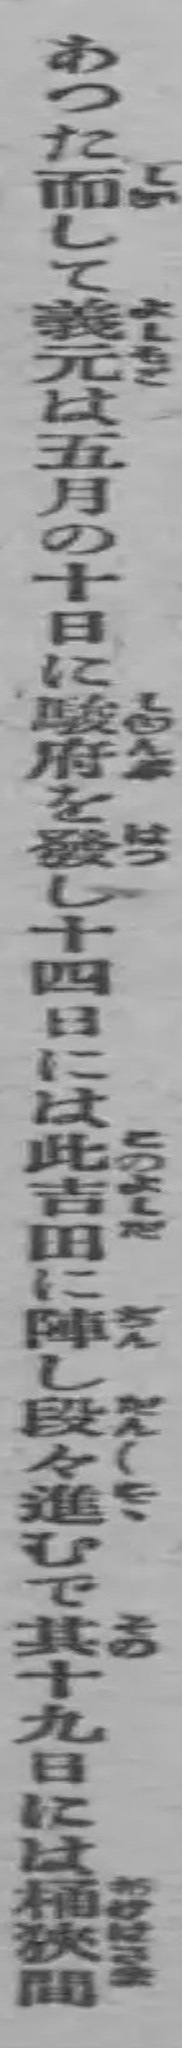あつた而して義元は五月の十日に駿府を発し十四日には此吉田に陣し段々進むで其十九日には桶狭間
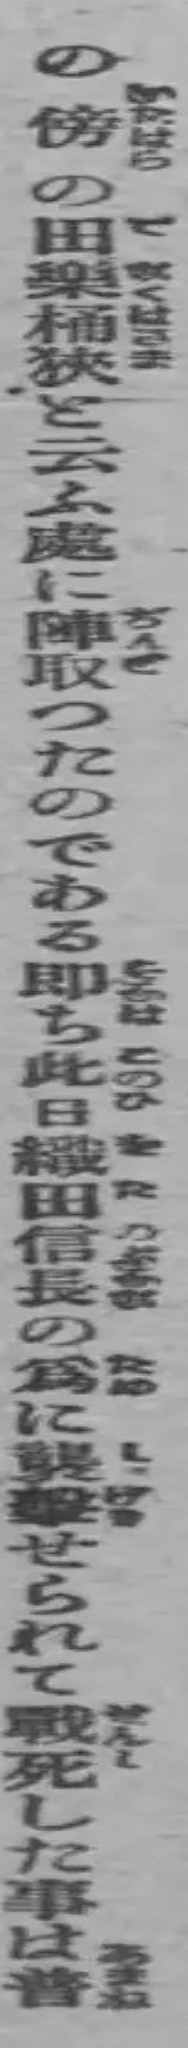の傍の田楽狭間と云ふ処に陣取つたのである即ち此日織田信長の為に襲撃せられて戦死した事は普
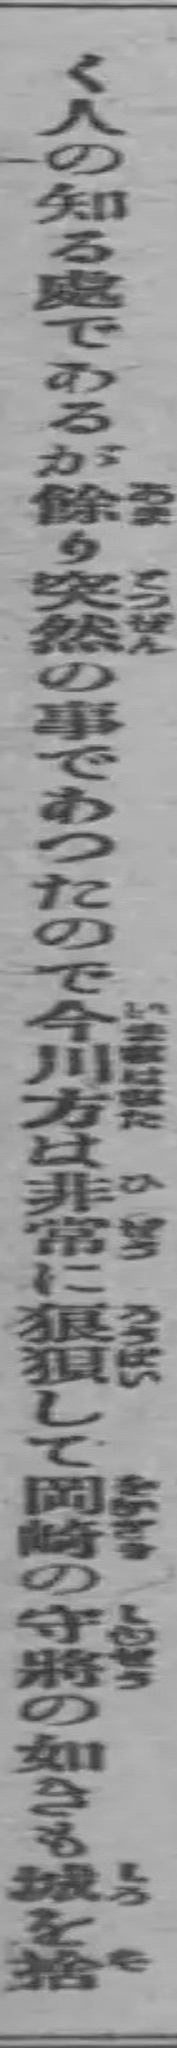く人の知る処であるが余り突然の事であつたので今川方は非常に狼狽して岡崎の守将の如きも城を捨

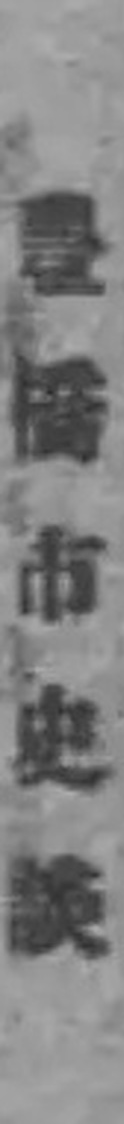豊橋市史談
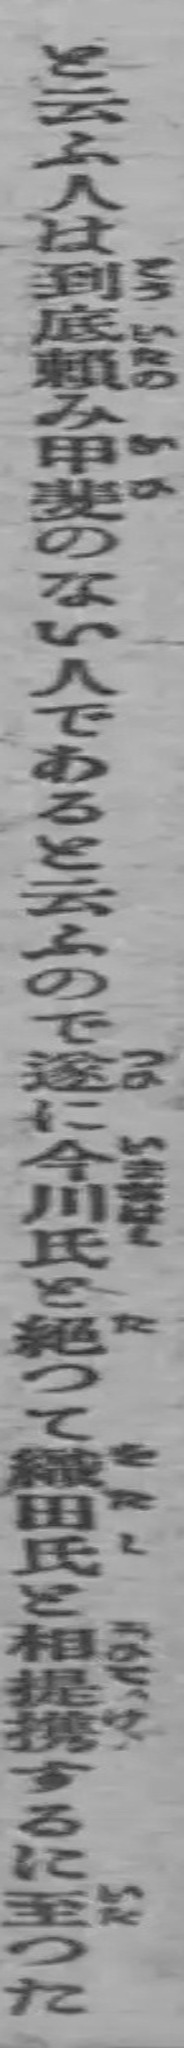と云ふ人は到底頼み甲斐のない人であると云ふので遂に今川氏と絶つて織田氏と相提携するに至つた
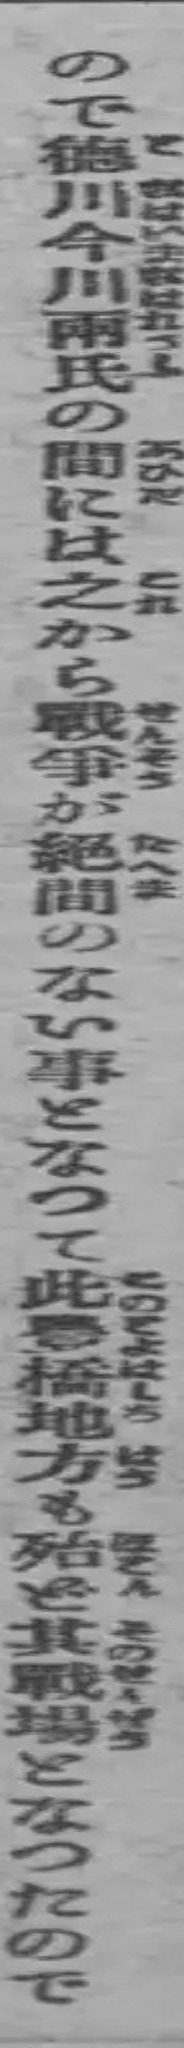ので徳川今川両氏の間には之から戦争が絶間のない事となつて此豊橋地方も殆ど其戦場となつたので
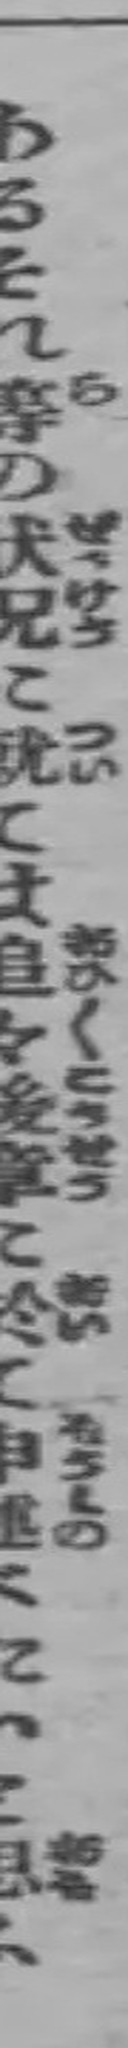あるそれ等の状況に就ては追々後章に於て申述べたいと思ふ
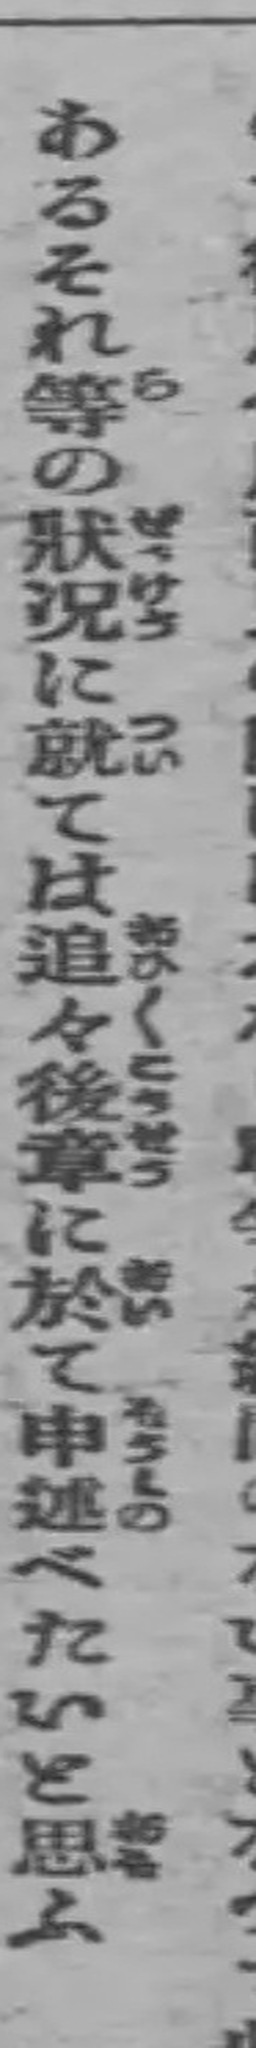あるそれ等の状況に就ては追々後章に於て申述べたいと思ふ
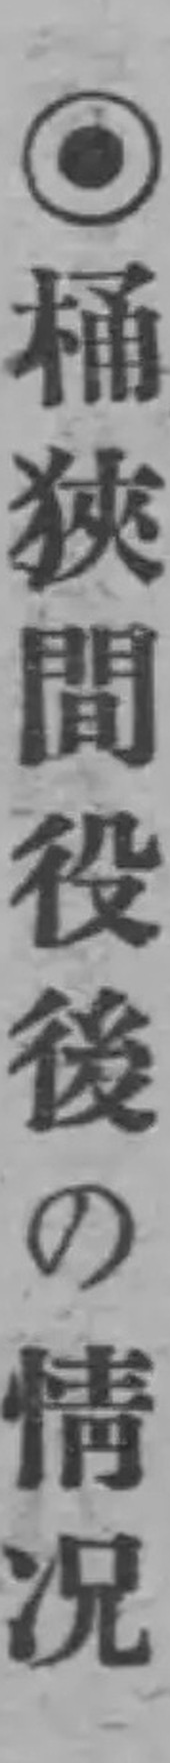⦿桶狭間役後の情況
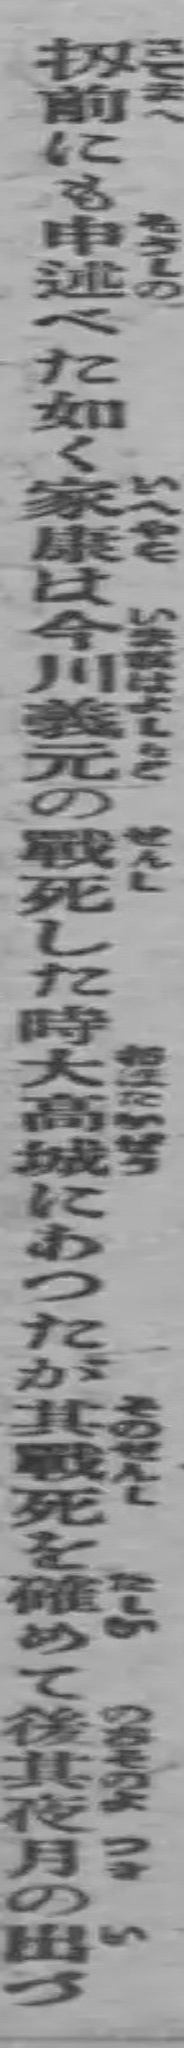扨前にも申述べた如く家康は今川義元の戦死した時大高城にあつたが其戦死を確めて後其夜月の出づ
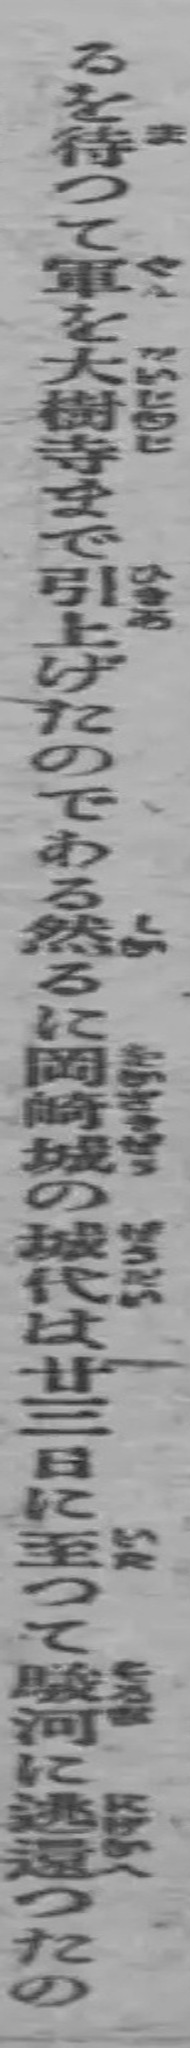岡崎城代るを待つて軍を大樹寺まで引上げたのである然るに岡崎城の城代は廿三日に至つて駿河に逃還つたの
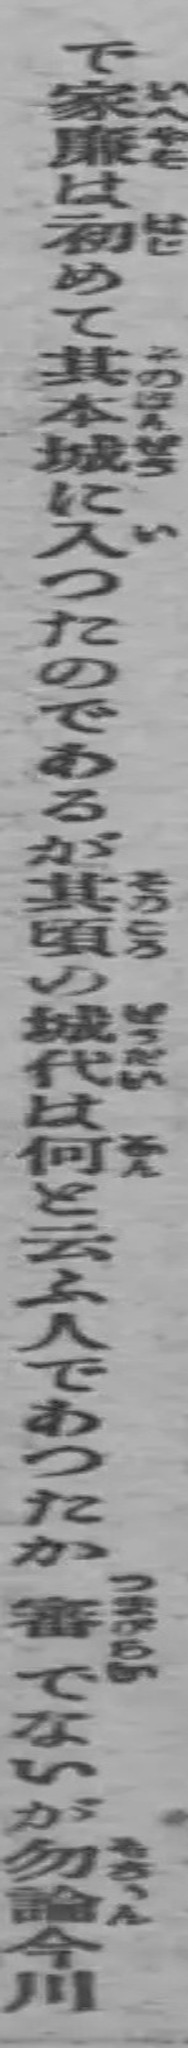で家康は初めて其本城に入つたのであるが其頃の城代は何と云ふ人であつたか審でないが勿論今川
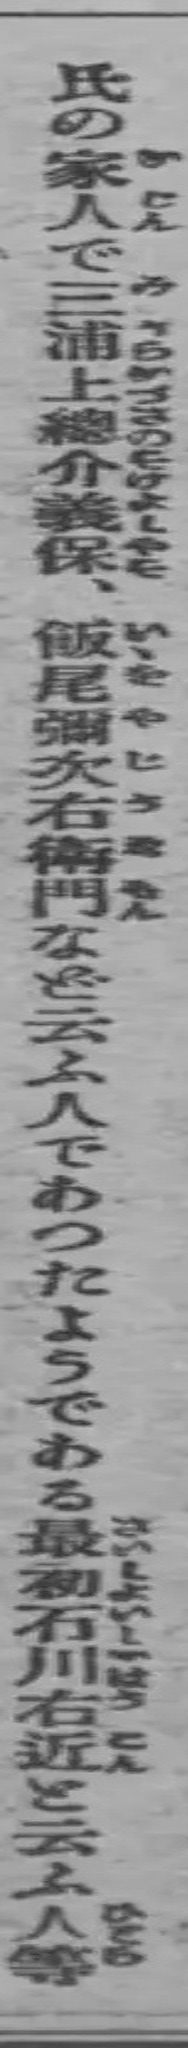氏の家人で三浦上総介義保、飯尾弥次右衛門など云う人であつたようである最初石川右近と云ふ人等
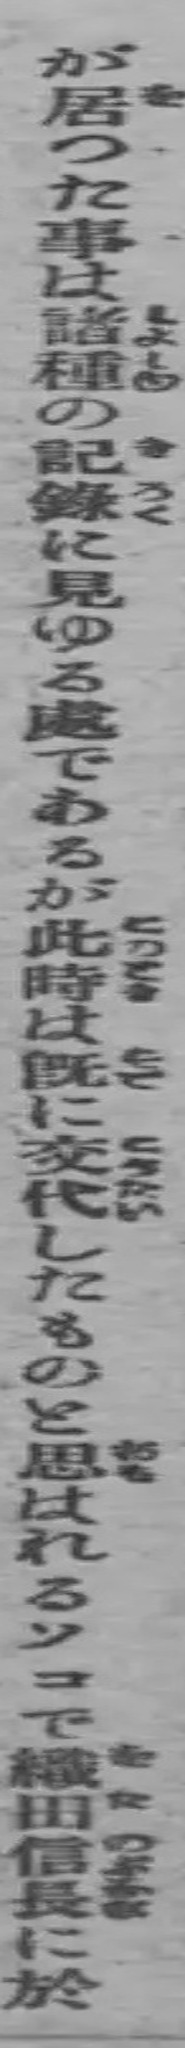が居つた事は諸種の記録に見ゆる処であるが此時は既に交代したものと思はれるソコで織田信長に於
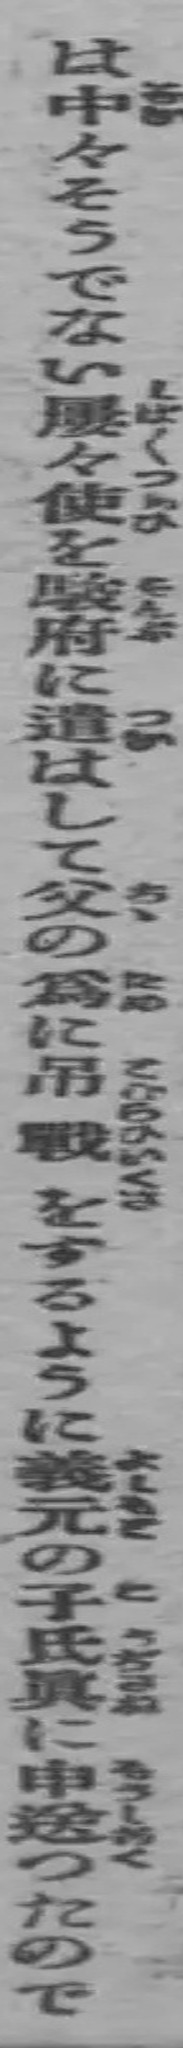は中々そうでない屡々使を駿府に遣はして父の為に吊戦をするように義元の子氏真に申送つたので
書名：豊橋市史談
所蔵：国立国会図書館 National Diet Library, JAPAN
